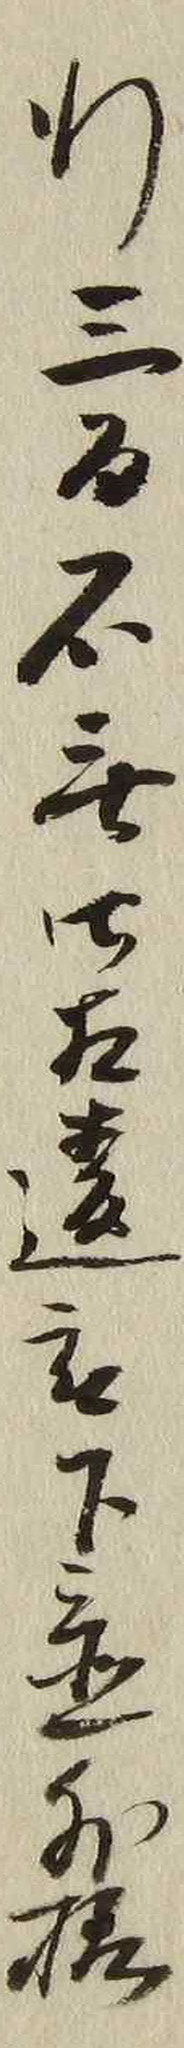行三百石無御相違被下置外様
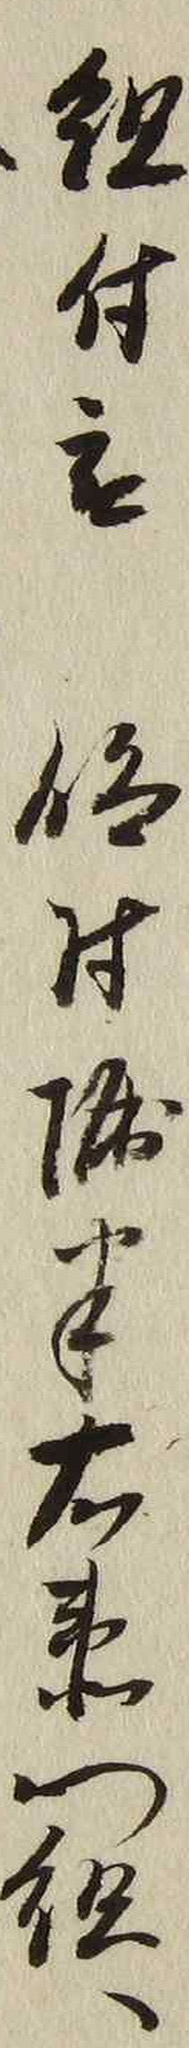組付被仰付堀半右衛門組へ
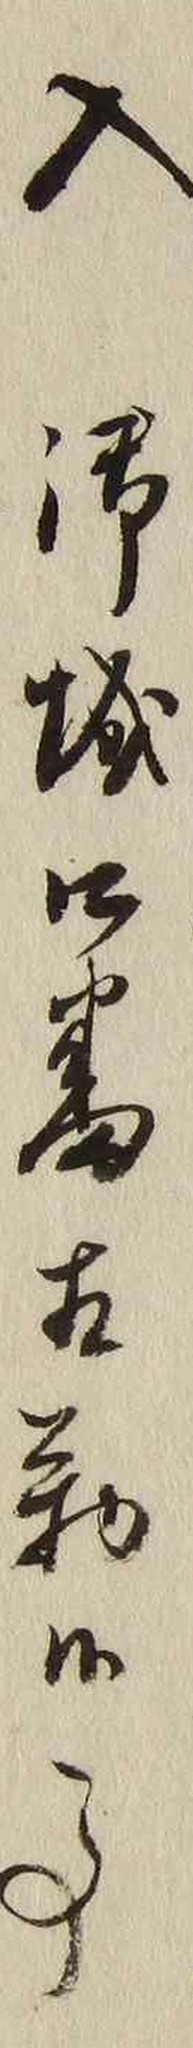入御城御番相勤候事
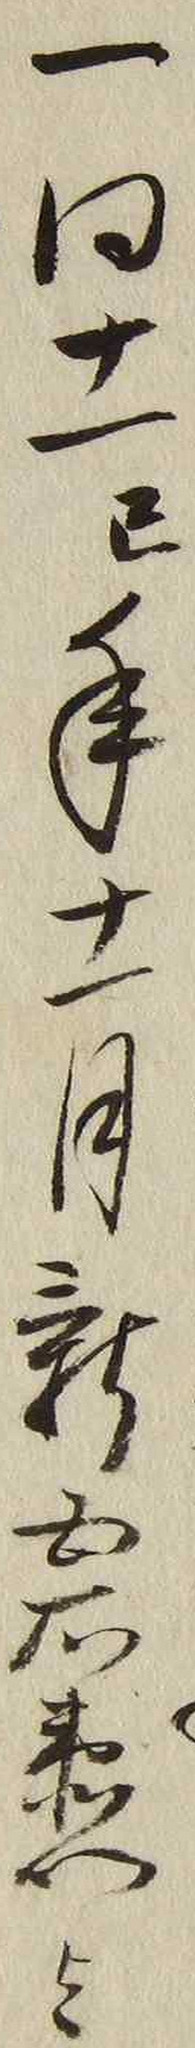一同十一巳年十一月新五右衛門与
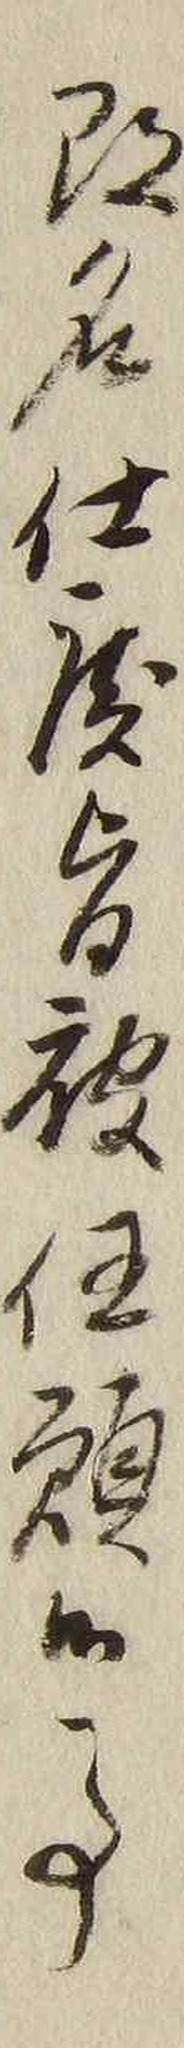改名仕度旨被任願候事
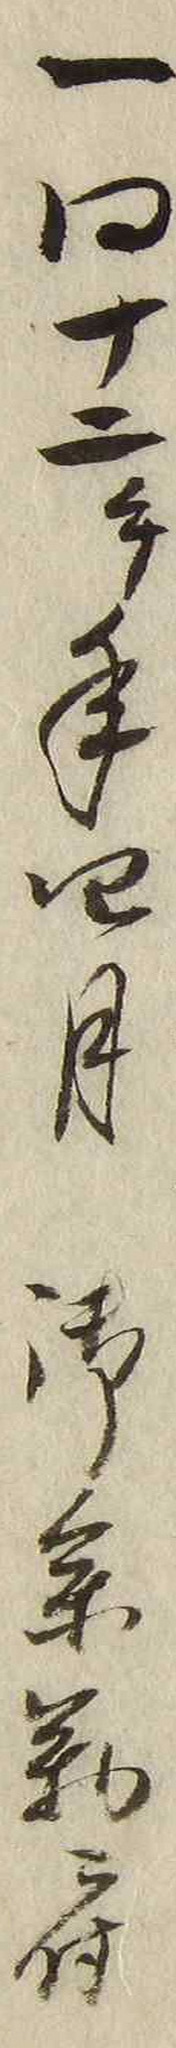一同十二午年四月御参勤ニ付

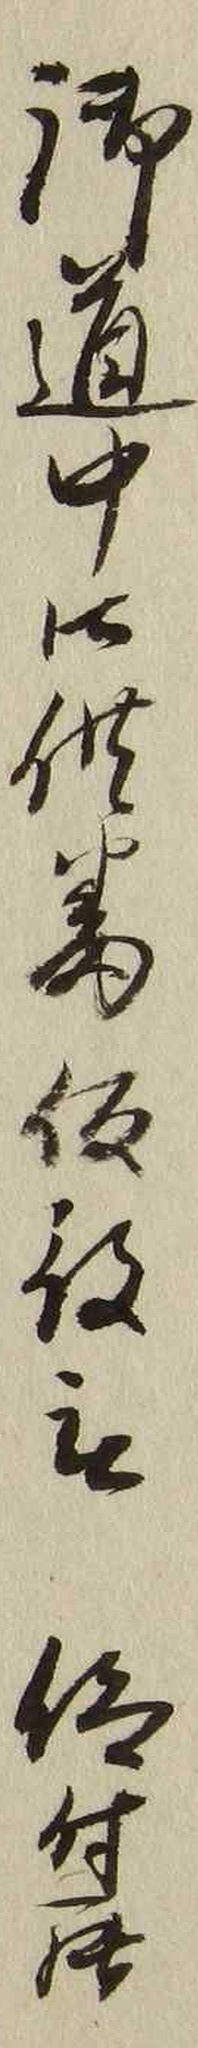御道中御供番仮役被仰付罷
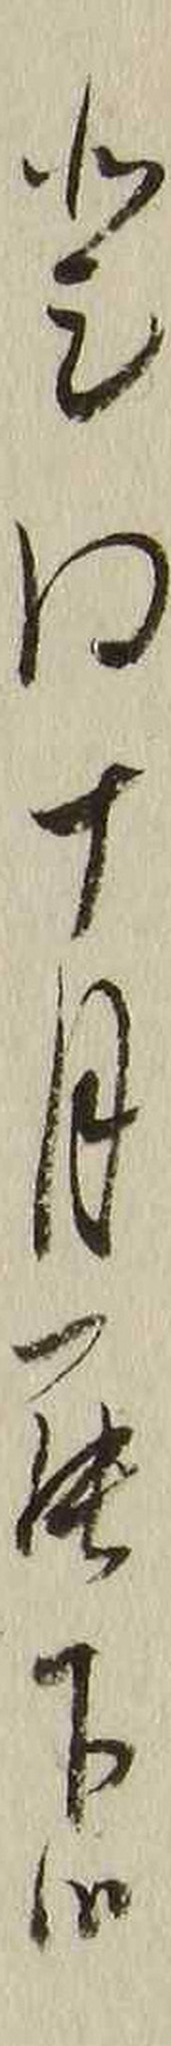登同十月罷下御
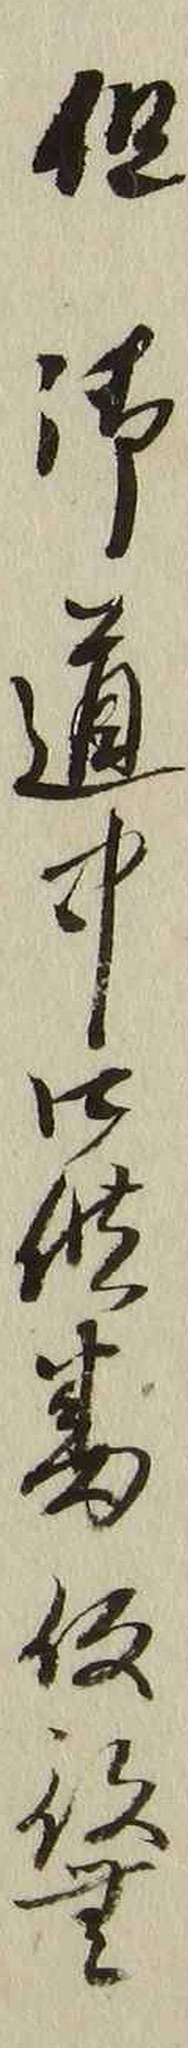但御道中御供番仮役無
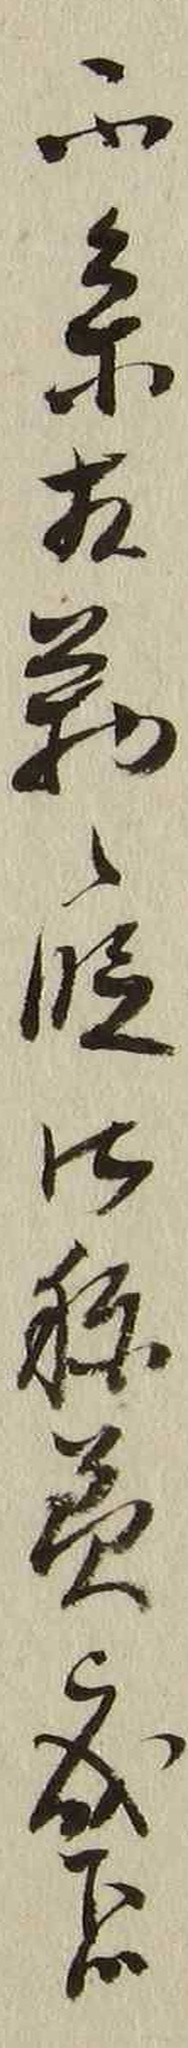不参相勤候段御称美被成下候
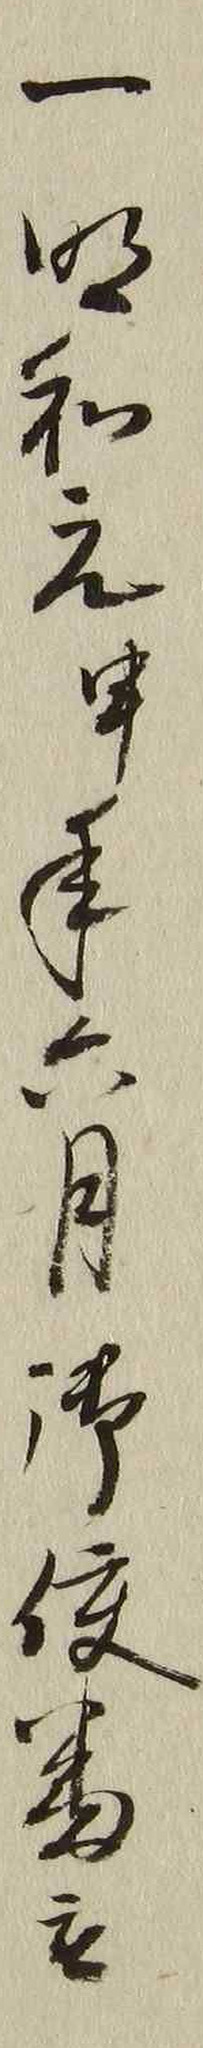一明和元申年六月御使番被
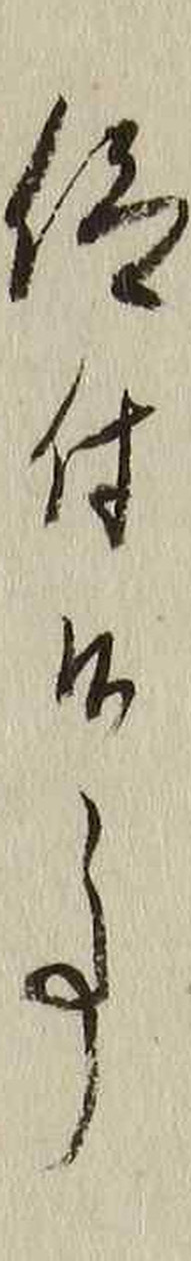仰付候事
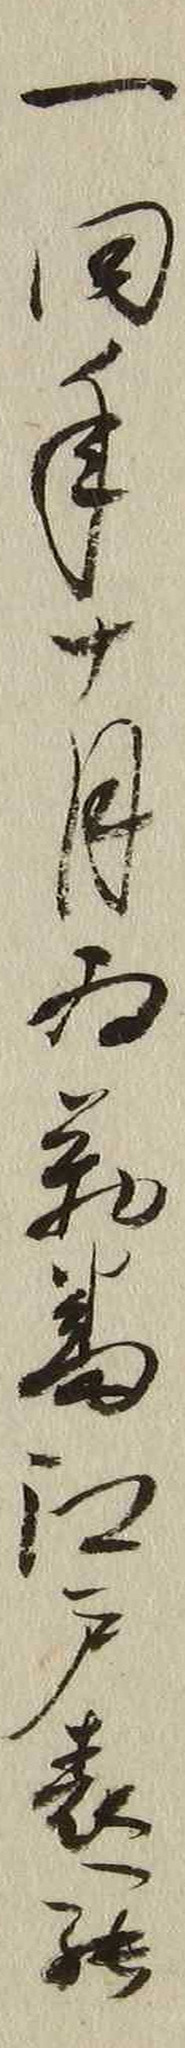一同年十月為勤番江戸表へ罷
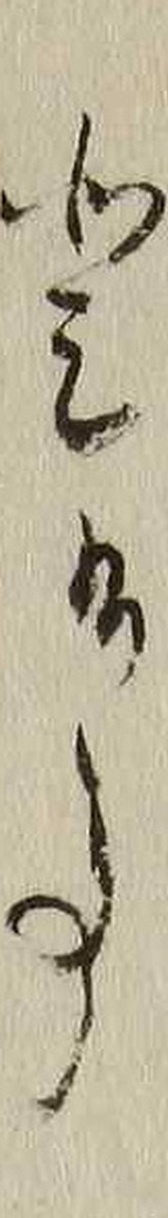登候事
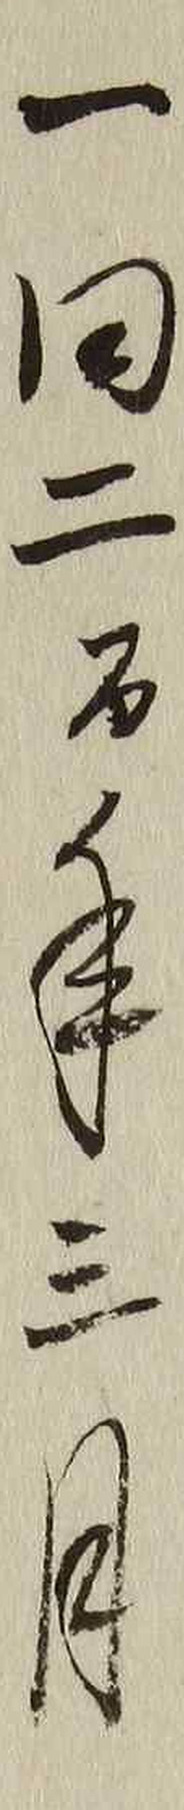一同二酉年三月
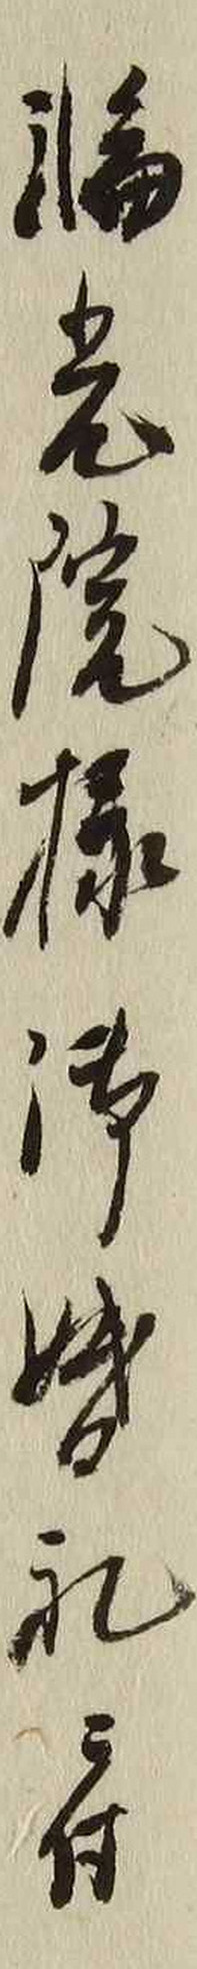輪光院様御婚礼ニ付
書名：諸士系譜　巻之355　す之部5
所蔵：会津若松市立会津図書館
